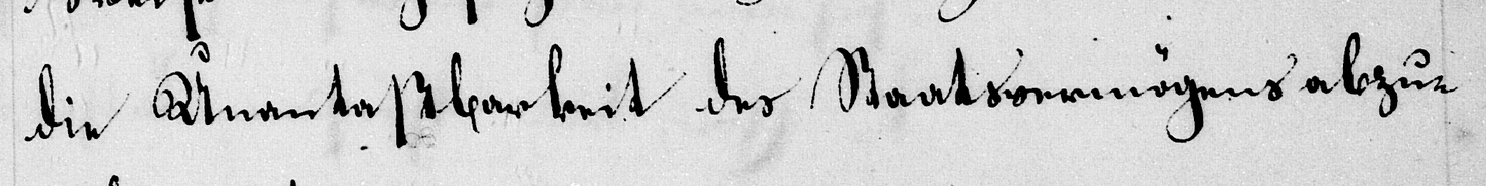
die Unantastbarkeit des Staatsvermögens abzu¬
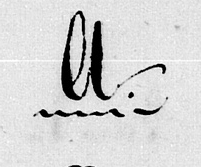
A.
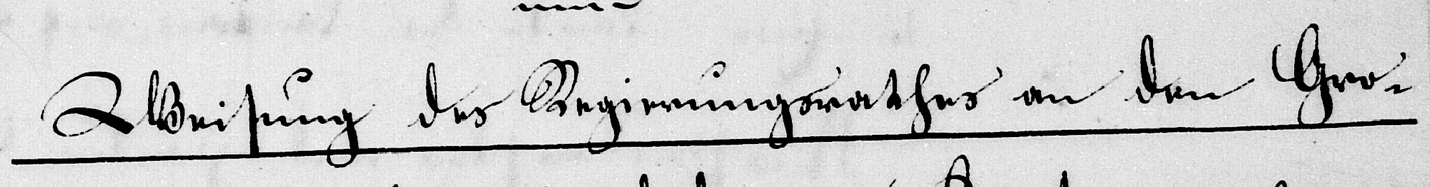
Weisung des Regierungsrathes an den Gro¬
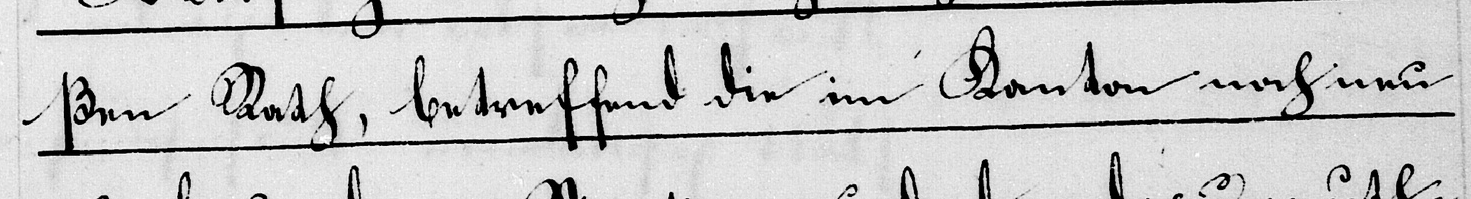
ßen Rath, betreffend die im Kanton noch neu
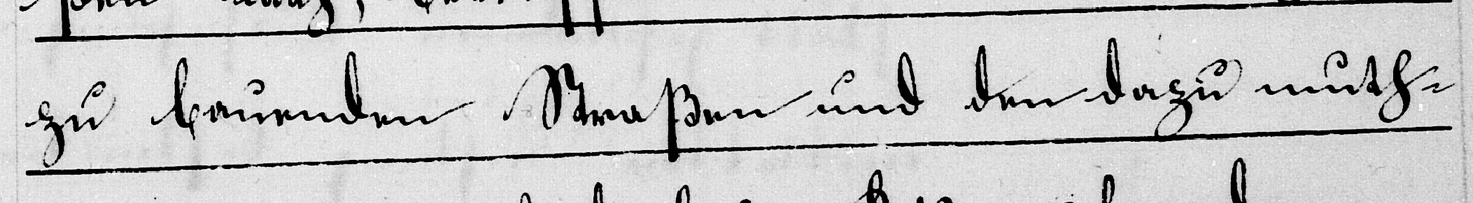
zu bauenden Straßen und den dazu muth¬
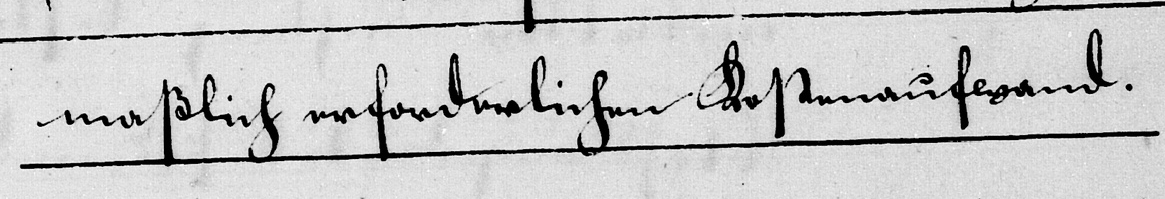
maßlich erforderlichen Kostenaufwand.
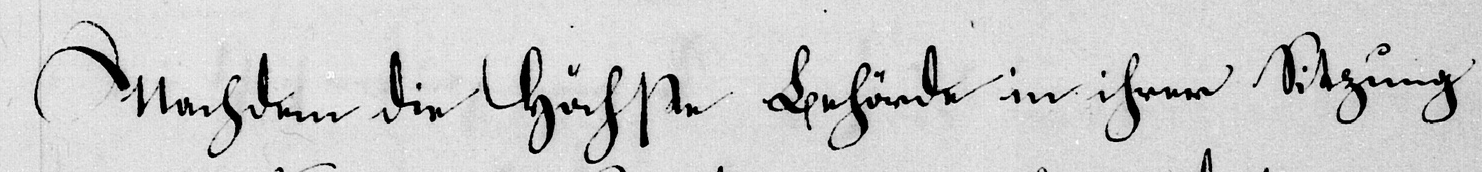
Nachdem die Höchste Behörde in ihrer Sitzung
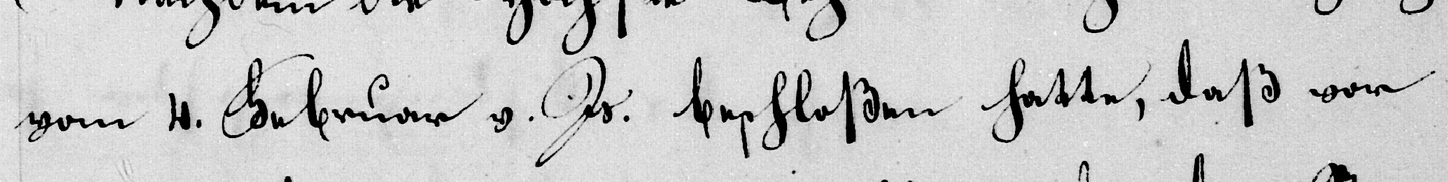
vom 4. Februar v. Js. beschloßen hatte, daß vor
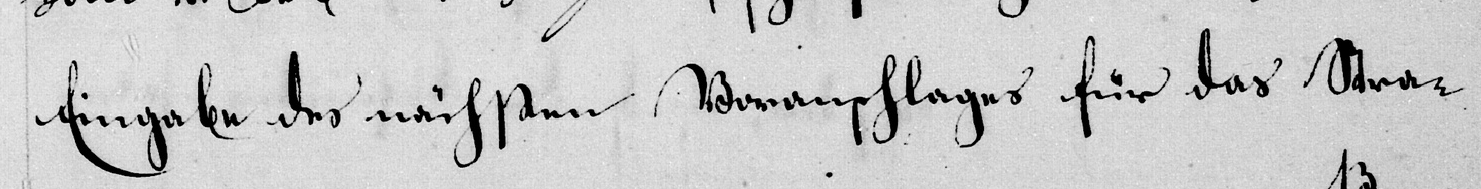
Eingabe des nächsten Voranschlages für das Stra-
